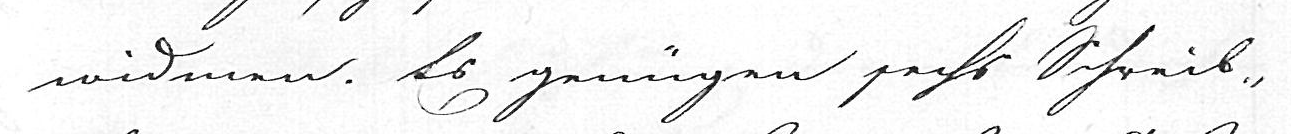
wimen. Es genügen sechs Schreib-
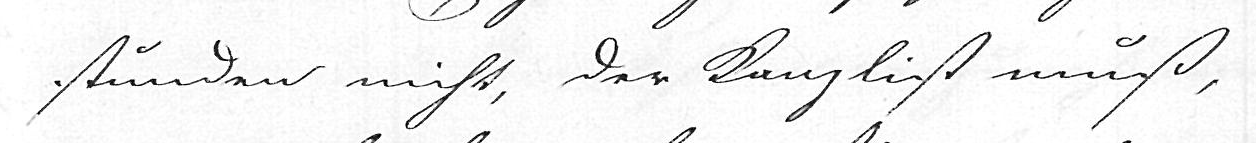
stunden nicht, der Kanzlist muß,
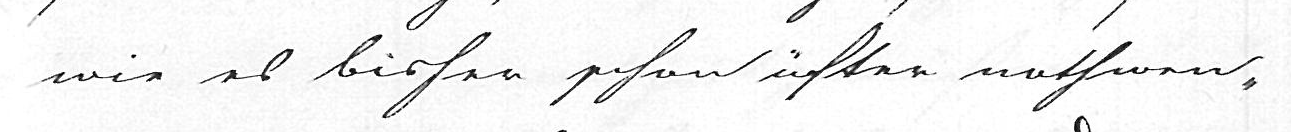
wie es bisher schon öfter nothwen-
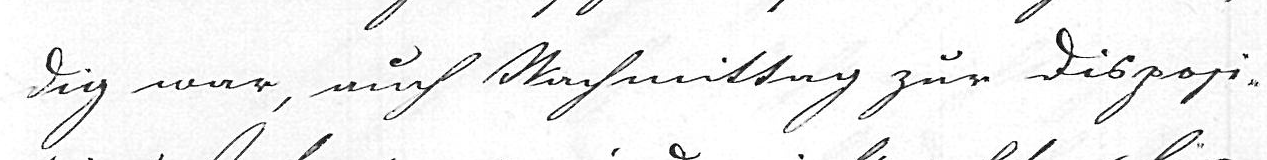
dig war, auch Nachmittag zur Dispos-
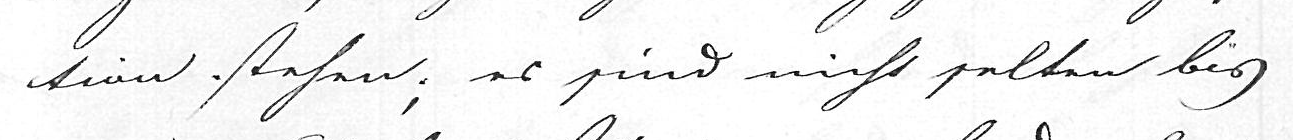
tion stehen; es sind nicht selten bis
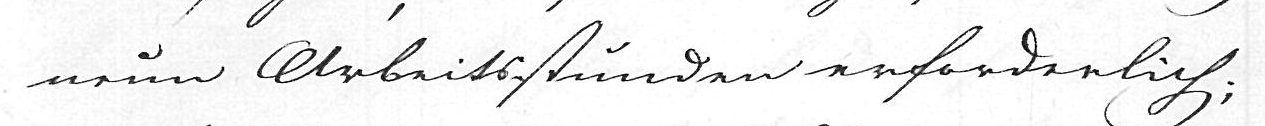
neun Arbeitsstunden erforderlich;
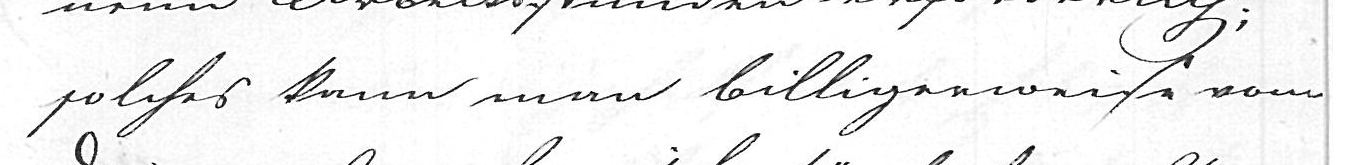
solches kann man billigerweise vom
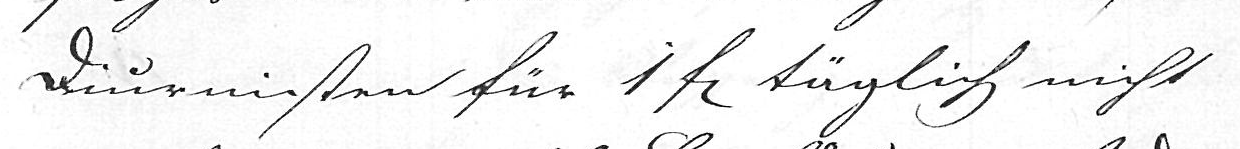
Diurnisten für 1 fl täglich nicht
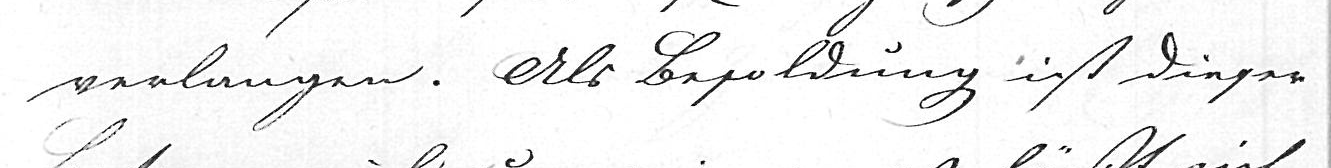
verlangen. Als Besoldung ist dieser
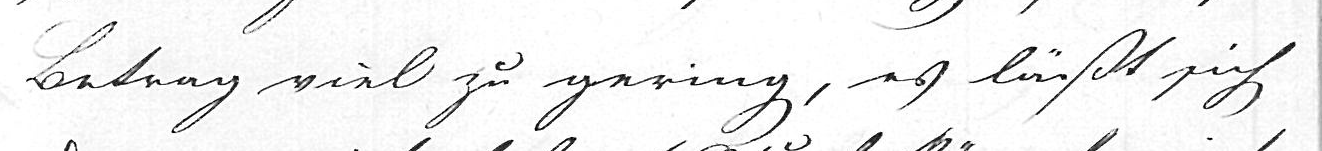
Betrag viel zu gering, es läßt sich
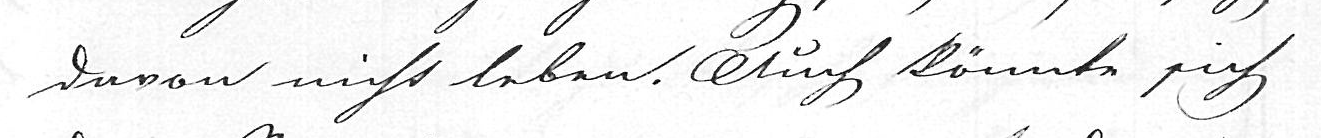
davon nicht leben. Auch könnte sich
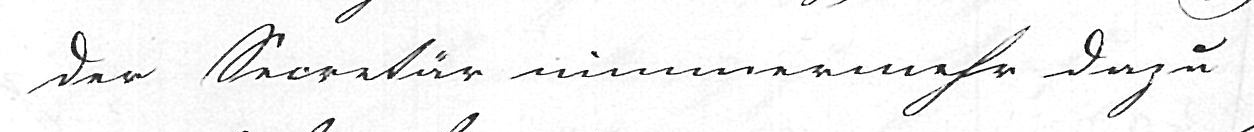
der Secretär nimmermehr dazu
